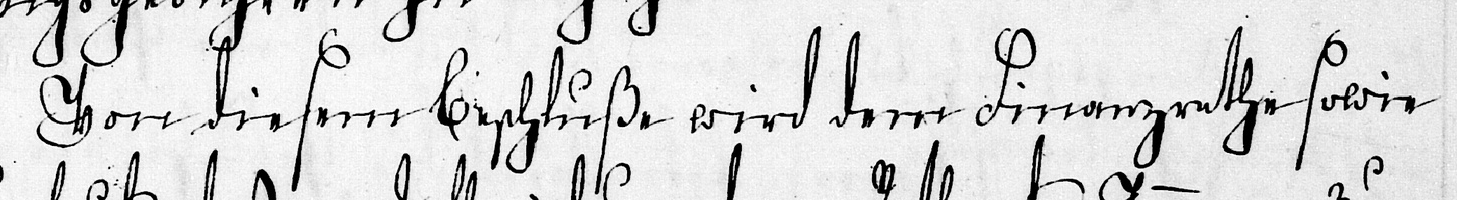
Von diesem Beschluße wird dem Finanzrathe sowie
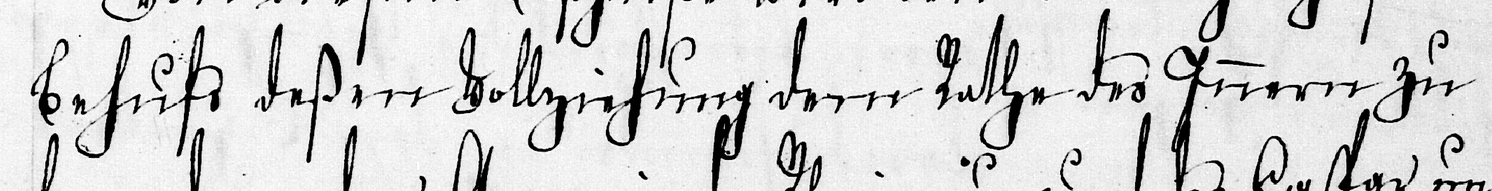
Behufs deßen Vollziehung dem Rathe des Innern zu
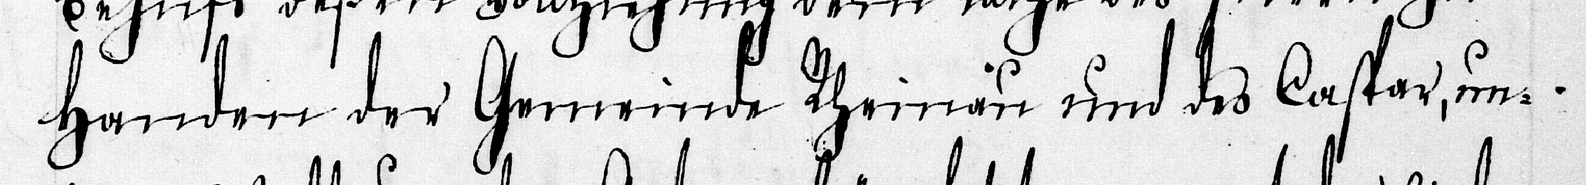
Handen der Gemeinde Rheinau und des Caspar, un¬
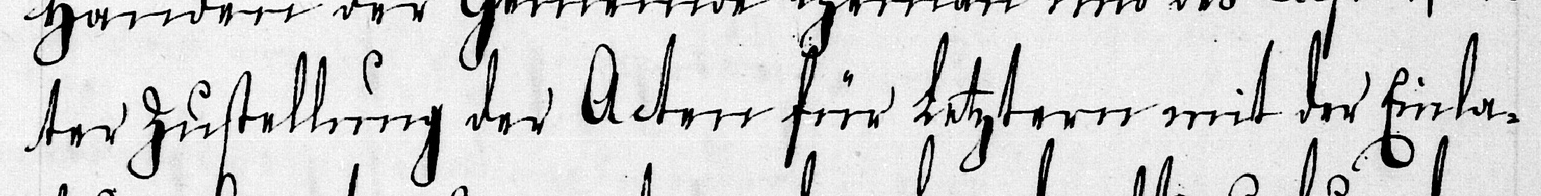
ter Zustellung der Acten für Letztern mit der Einla¬
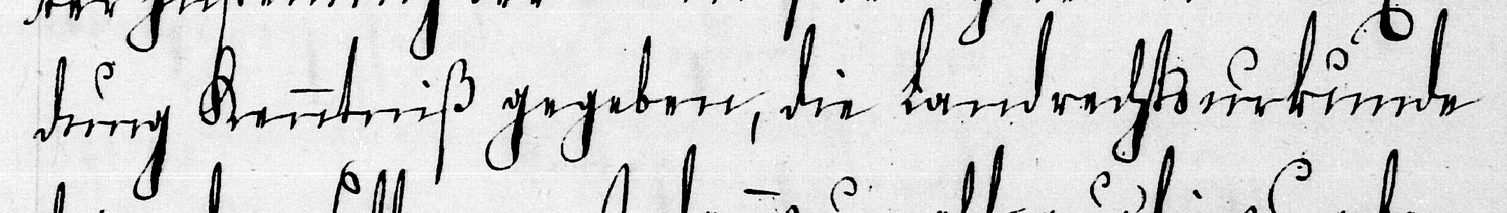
dung Kenntniß gegeben, die Landrechtsurkunde
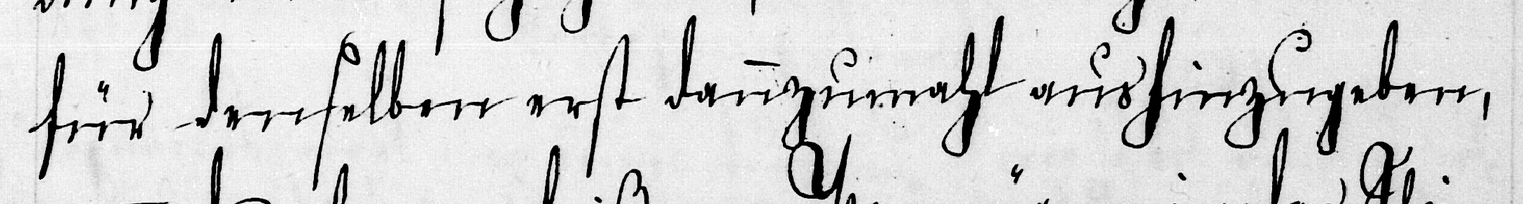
für denselben erst dannzumahl aushinzugeben,
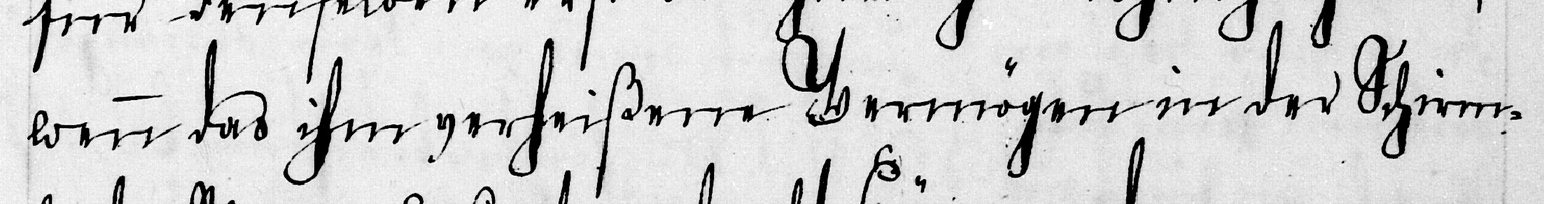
wenn das ihm verheißene Vermögen in der Schirm¬
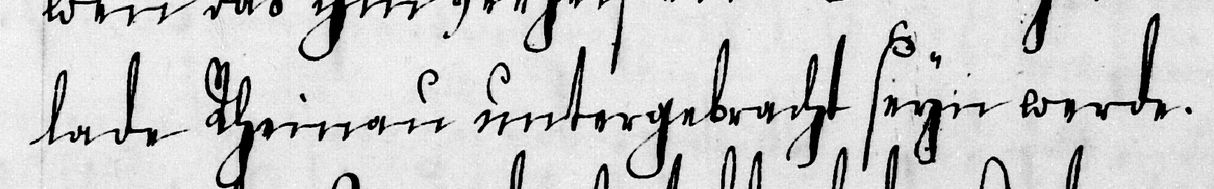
lade Rheinau untergebracht seyn werde.
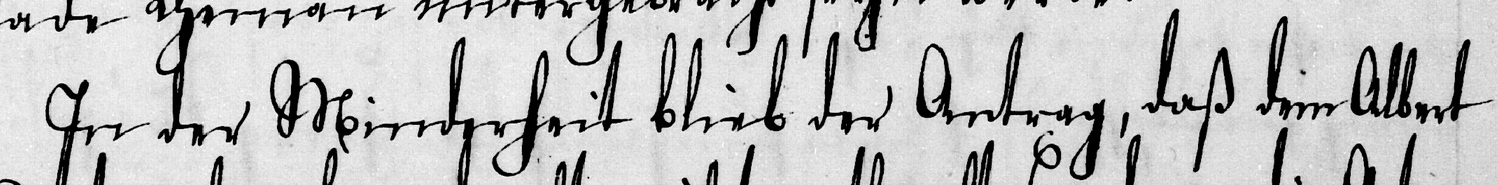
In der Minderheit blieb der Antrag, daß dem Albert
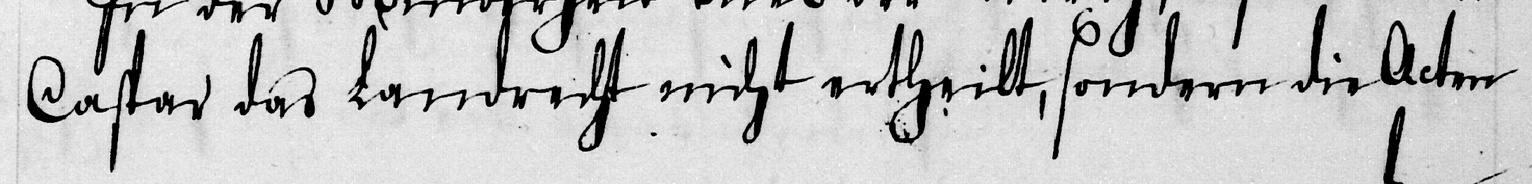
Caspar das Landrecht nicht ertheilt, sondern die Acten
